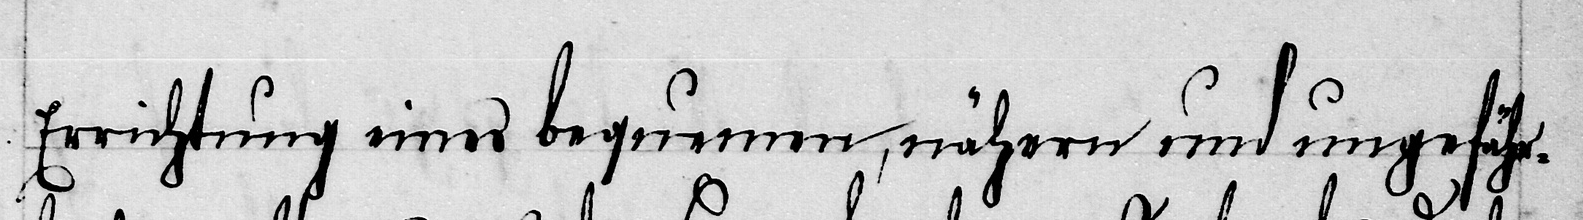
Errichtung eines bequemen, nähern und ungefähr¬
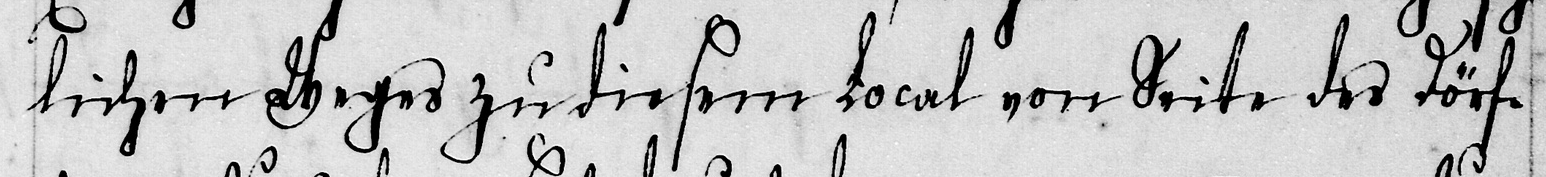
lichen Weges zu diesem Local von Seite des Dörf¬
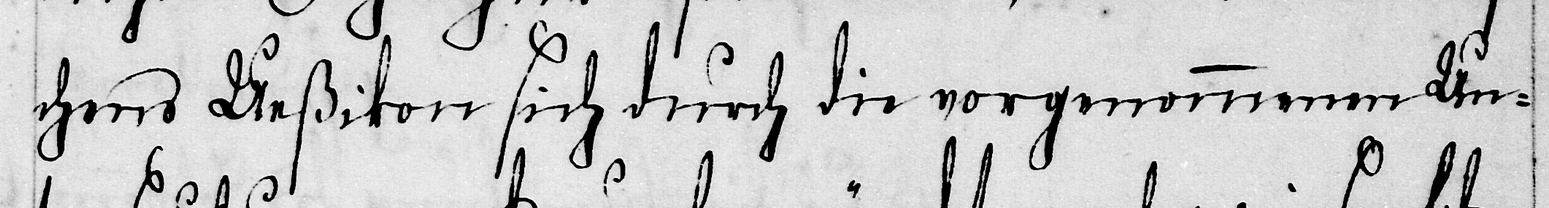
chens Ueßikon sich durch die vorgenommenen Un¬
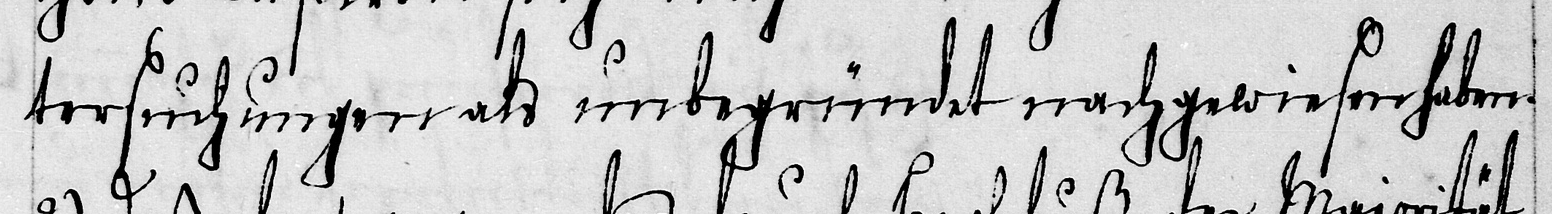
tersuchungen als unbegründet nachgewiesen haben.
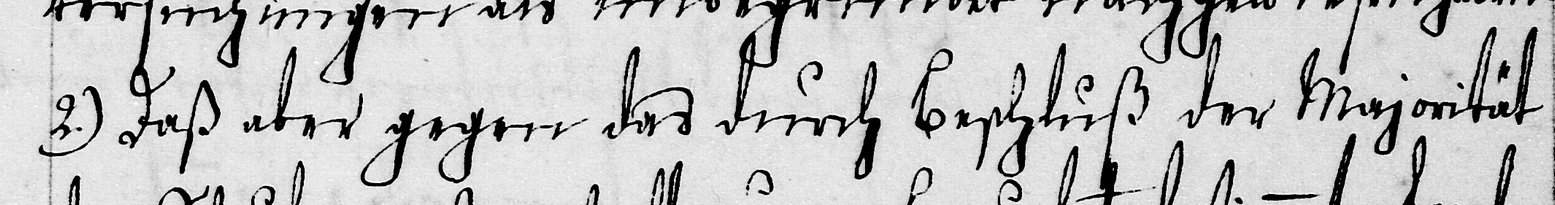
2.) Daß aber gegen das durch Beschluß der Majorität
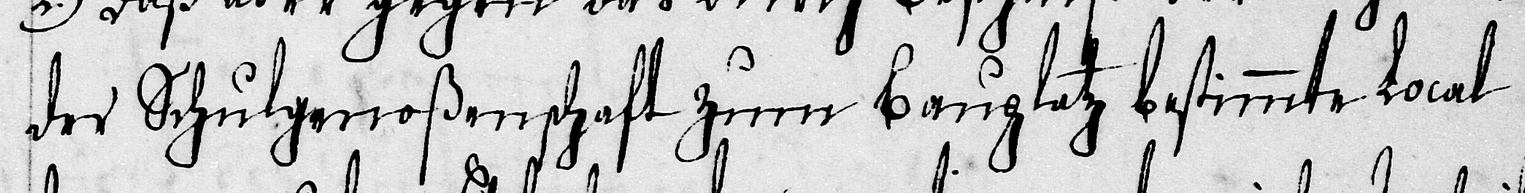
der Schulgenoßenschaft zum Bauplatz bestimmte Local
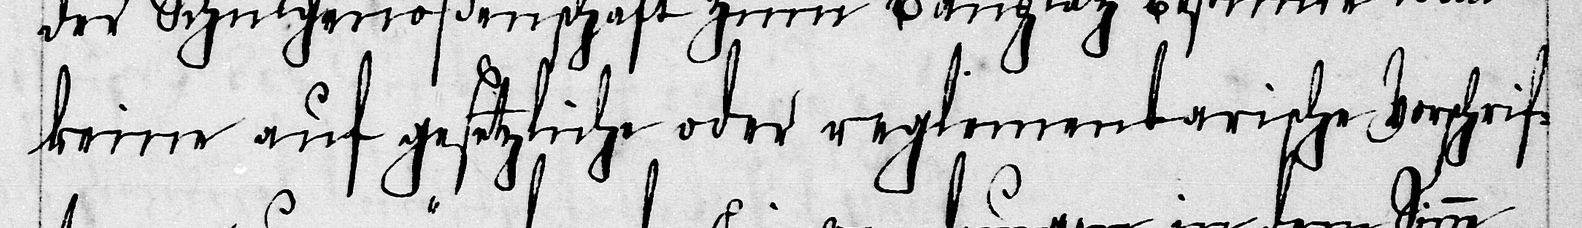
keine auf gesetzliche oder reglementarische Vorschrif¬
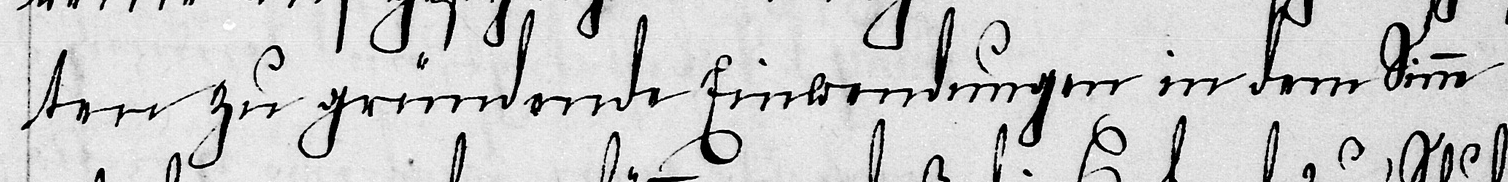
ten zu gründende Einwendungen in dem Sinne
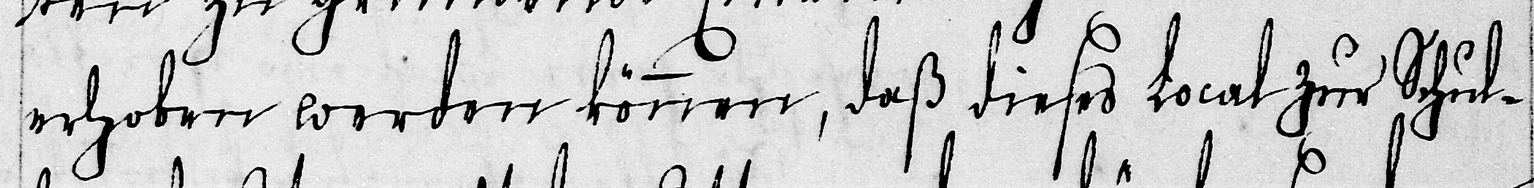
erhoben werden können, daß dieses Local zur Schul¬
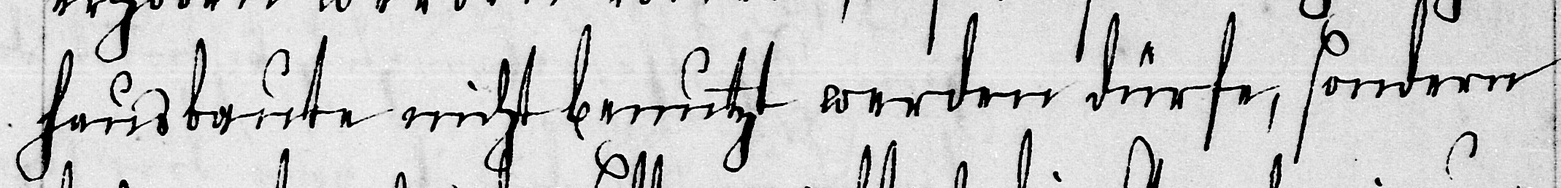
hausbaute nicht benutzt werden dürfe, sondern
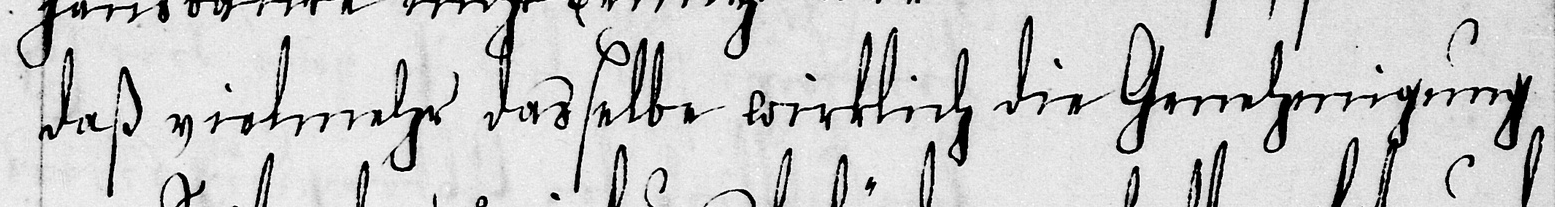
daß vielmehr dasselbe wirklich die Genehmigung
